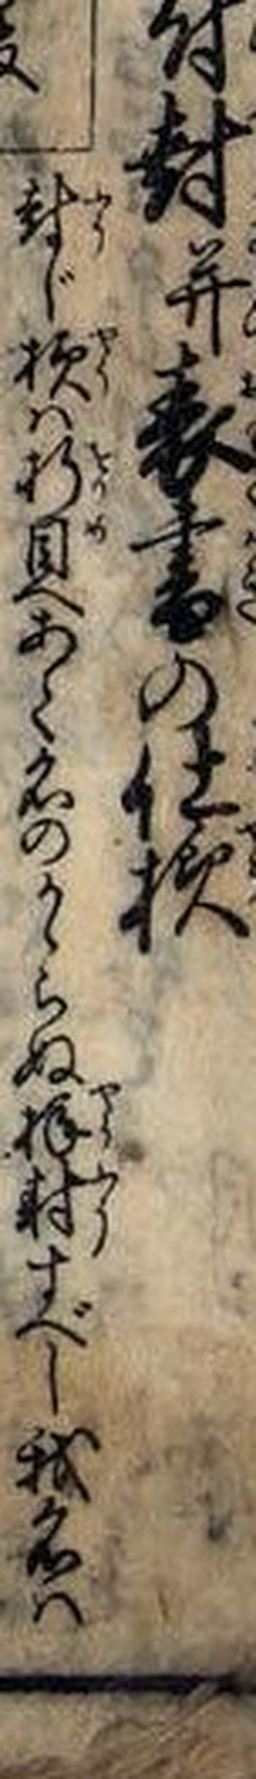封じ様は折目へあて名のかゝらぬ様封すべし我名は
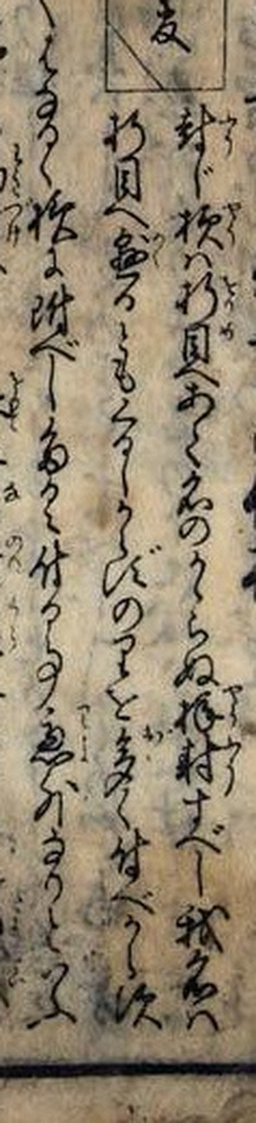折目へ懸るともくるしからずのりを多く付べからす
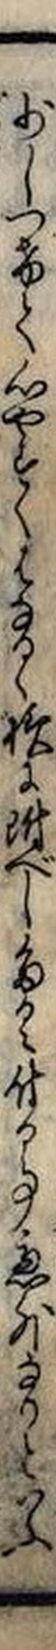少しつけて心やすくはなるゝ様に附べし多く付る事慮外なりといふ
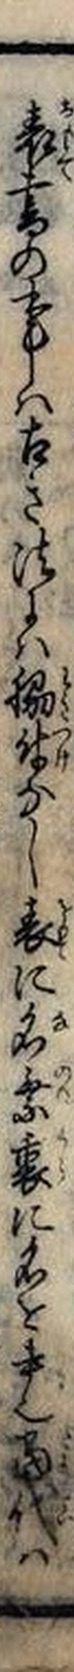表書の事は古き法には脇付なし表に名乗裏に名を書也當代は
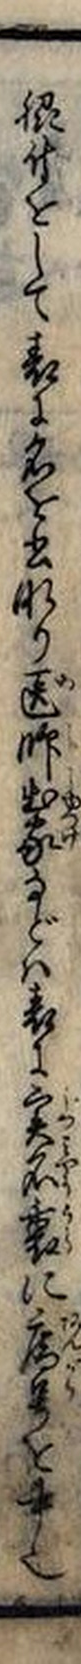脇付をして表に名を書なり医師出家などは表に実名裏に庵号を書也
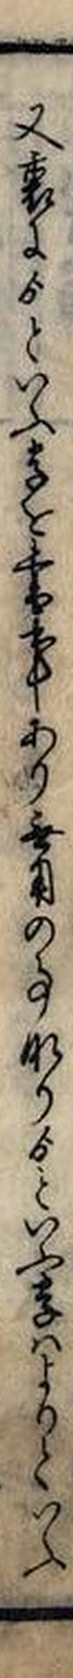又裏にゟといふ字を書事あり無用の事なりゟといふ字はよりといふ
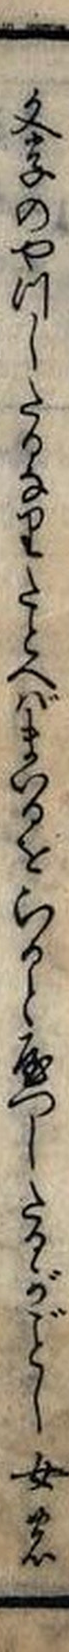文字のやつしたるなりたとへばまいるを「まいる」とやつしたるがごとし女の
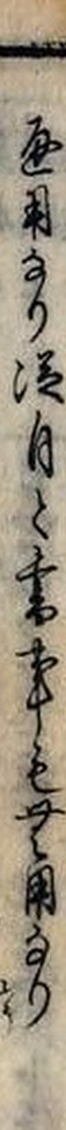通用なり従自と書事も無用なり
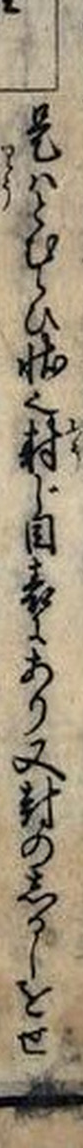是はとむらひ状之封じ目表にあり又封のしるしをせ
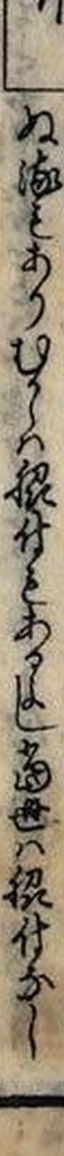ぬ流もありむかしは脇付もあるよし當世は脇付なし
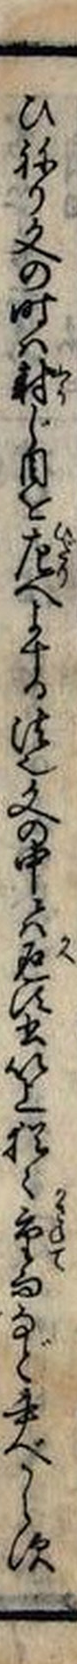ひねり文の時は封じ目を左へよする法也文の中には返す書以上猶々重而など書べからす
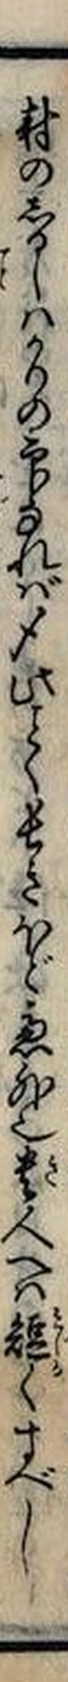封のしるしはかりの印なれば〆此ことく長きほど慮外也貴人へは短くすべし
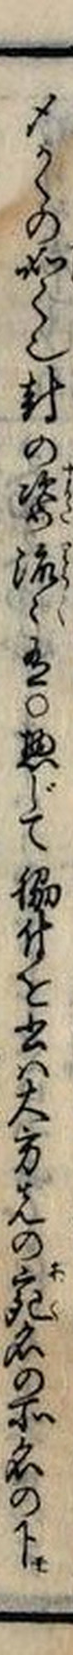〆かくの如く也封の姿流々有○惣じて脇付を書は大方先の宛名の所名の下も
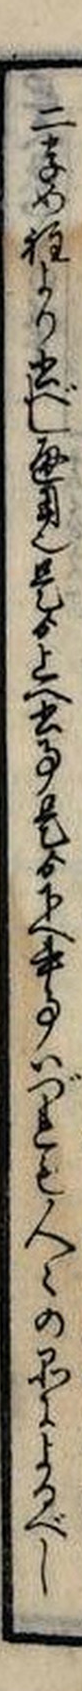二字め程より書べし通用之是ゟ上へ書事是ゟ下へ書事いづれも人々の品によるべし

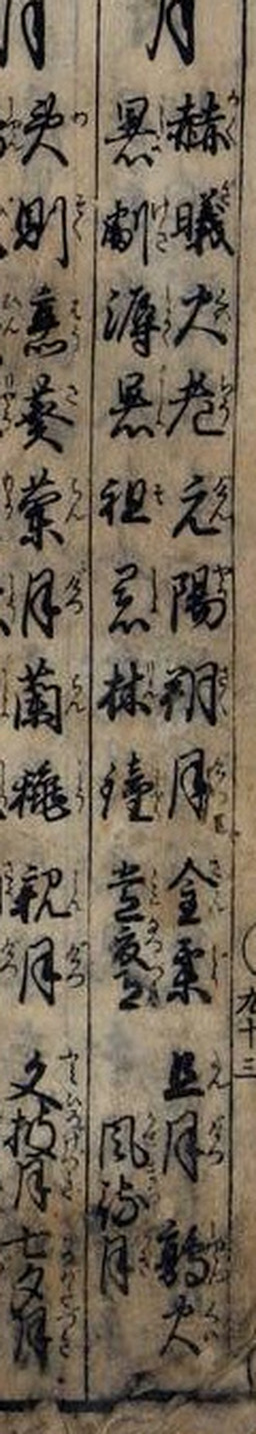暑劇溽暑祖暑林鐘常夏月風待月

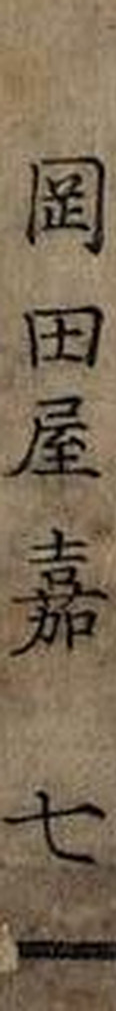岡田屋嘉七
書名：大成用文章（往来物）
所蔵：福井県文書館 Fukui Prefectural Archives
